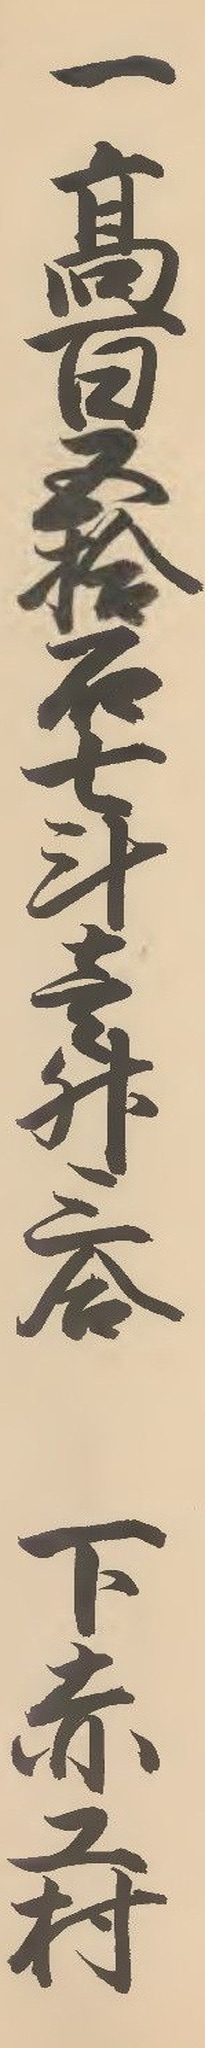一高百五拾石七斗壱升三合下赤工村
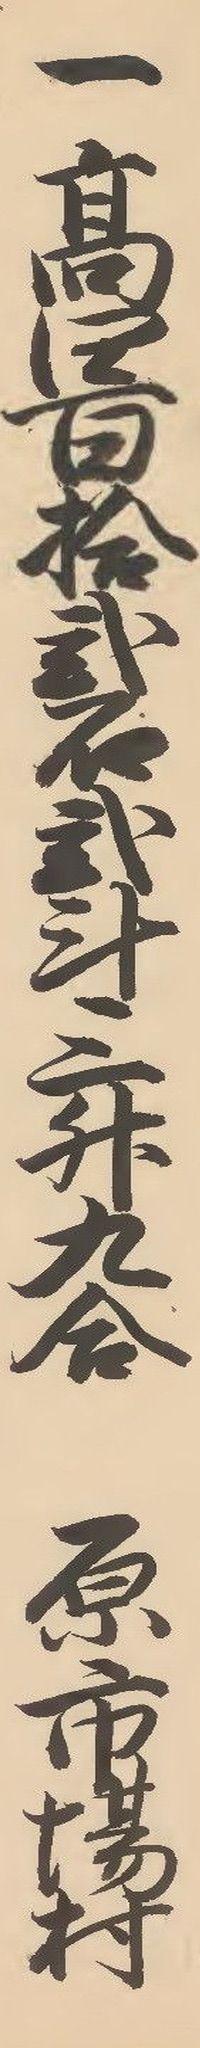一高四百拾弐石弐斗三升九合原市場村
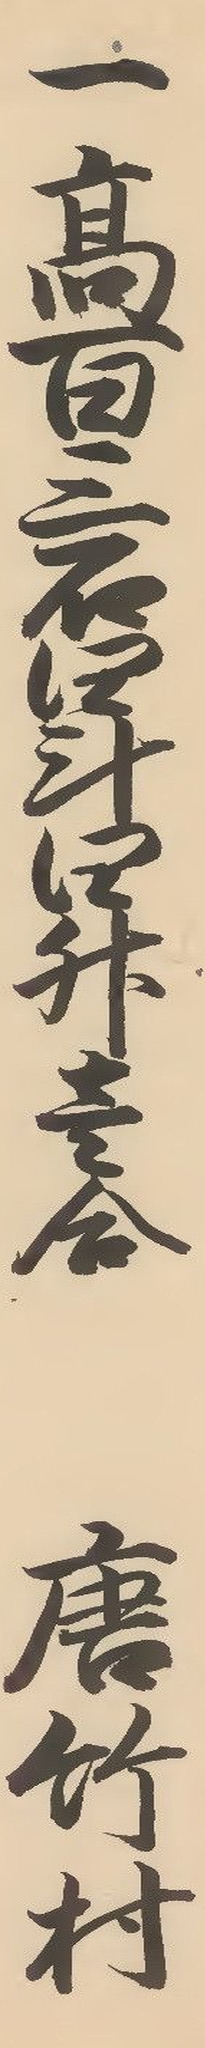一高百三石四斗四升壱合唐竹村
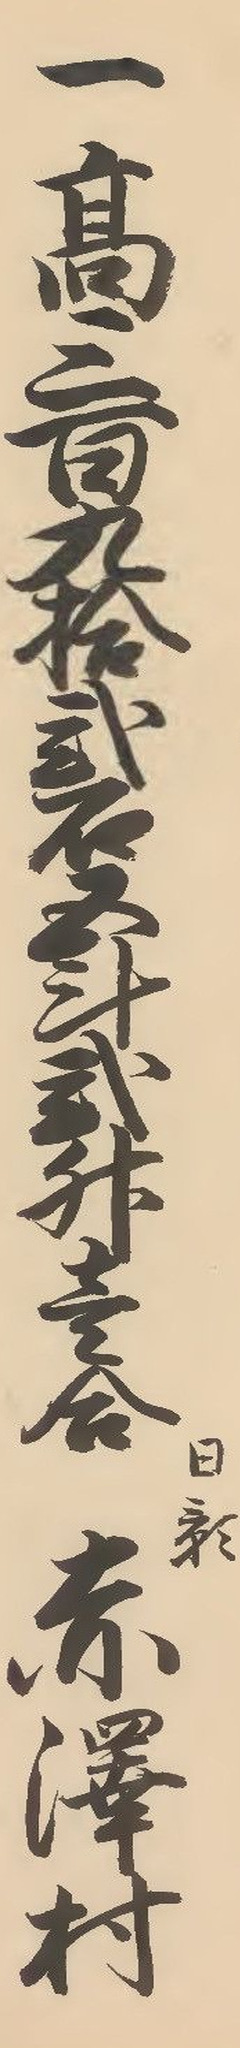一高三百九拾弐石五斗弐升壱合赤澤村
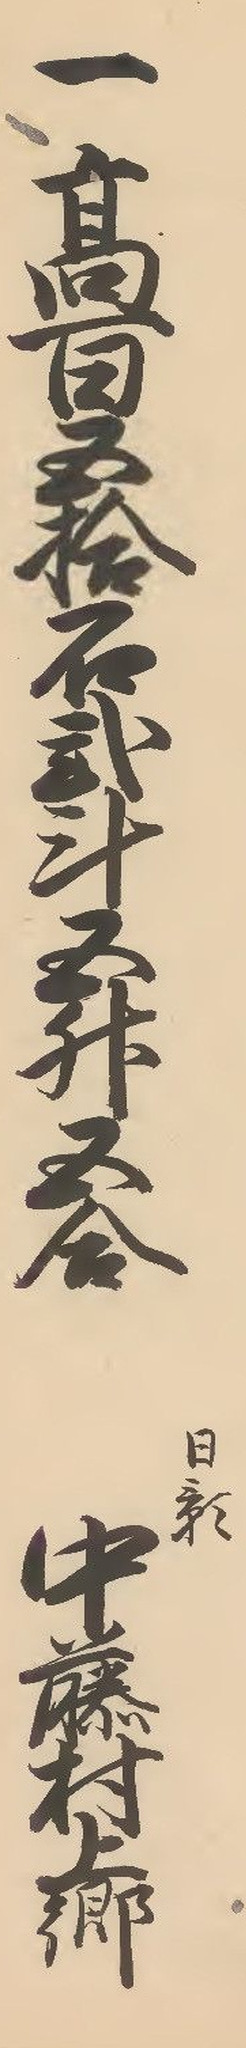一高百五拾石弐斗五升五合中藤村上郷

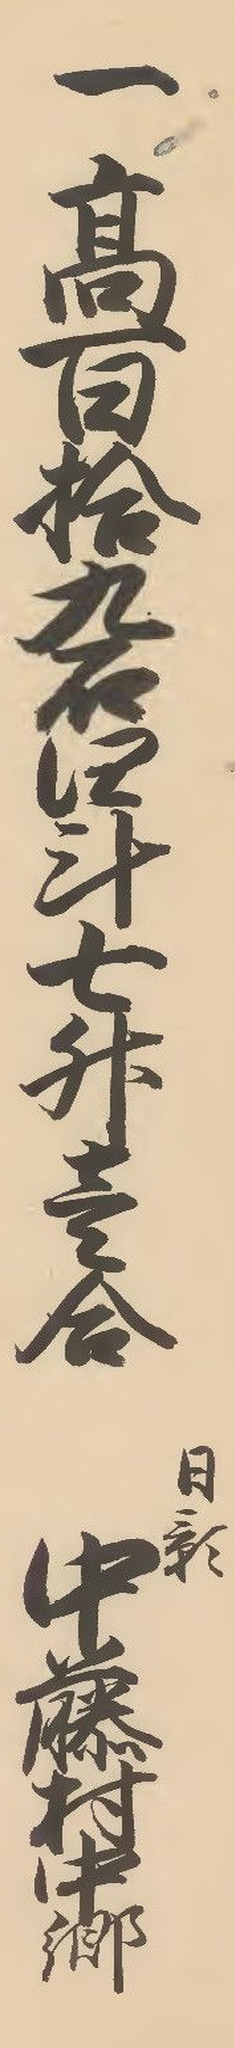一高百拾九石四斗七升壱合中藤村中郷
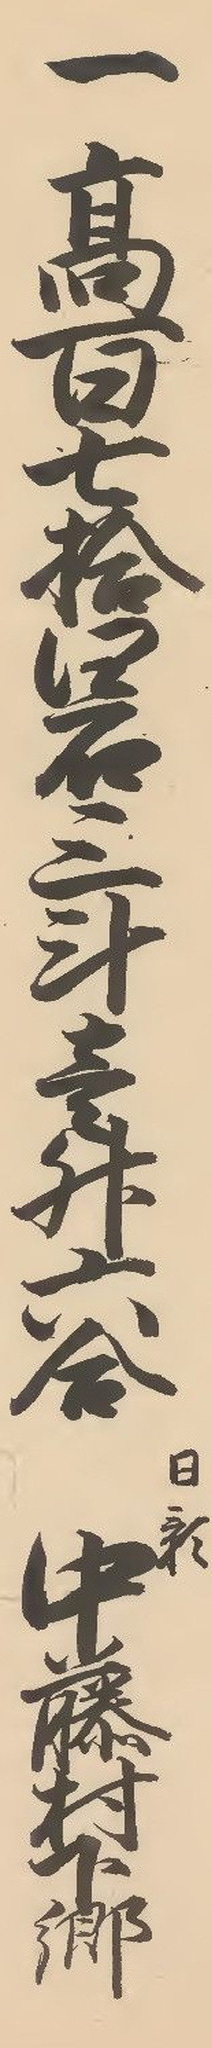一高百七拾四石三斗壱升六合中藤村下郷
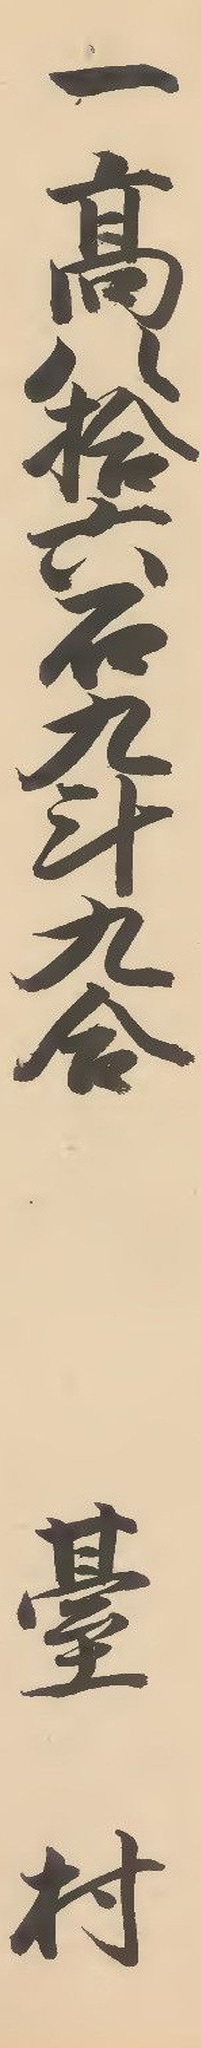一高八拾六石九斗九合䑓村
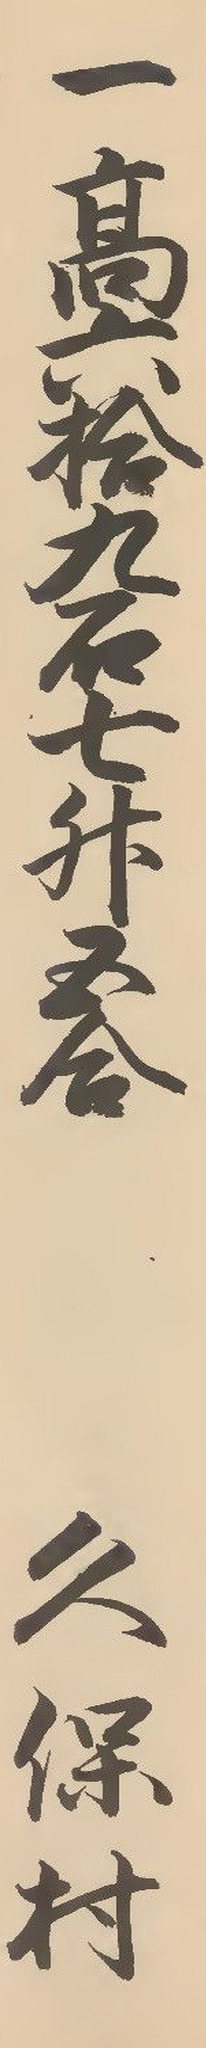一高六拾九石七升五合久保村
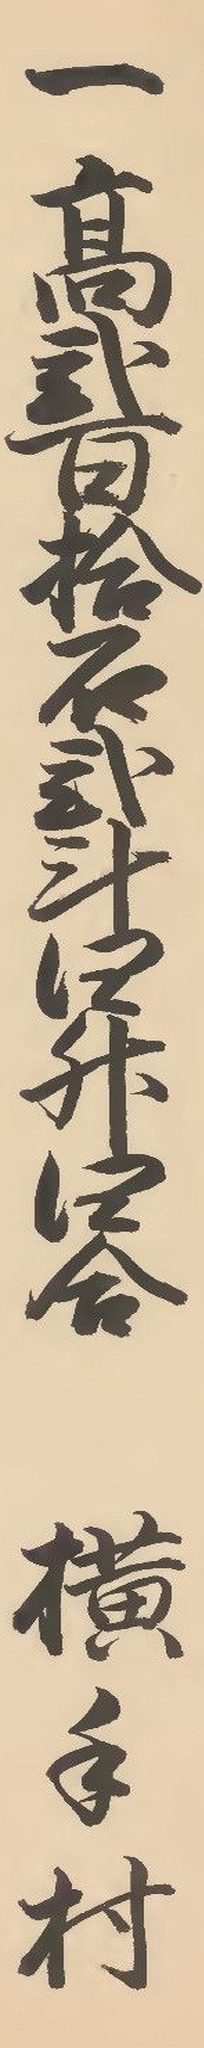一高弐百拾石弐斗四升四合横手村
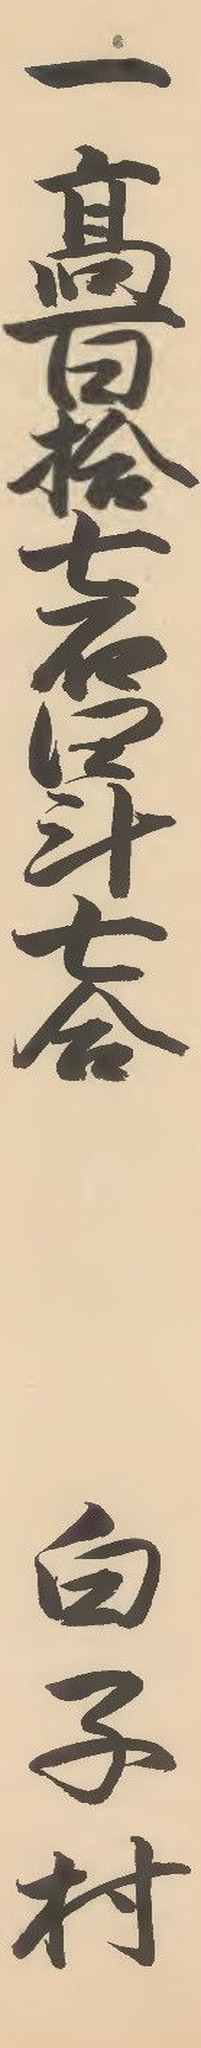一高百拾七石四斗七合白子村
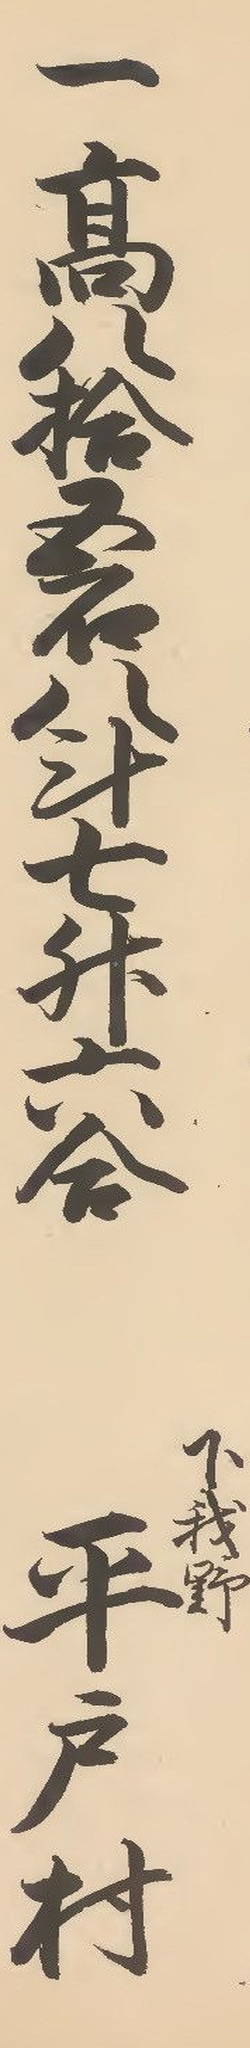一高八拾五石八斗七升六合平戸村
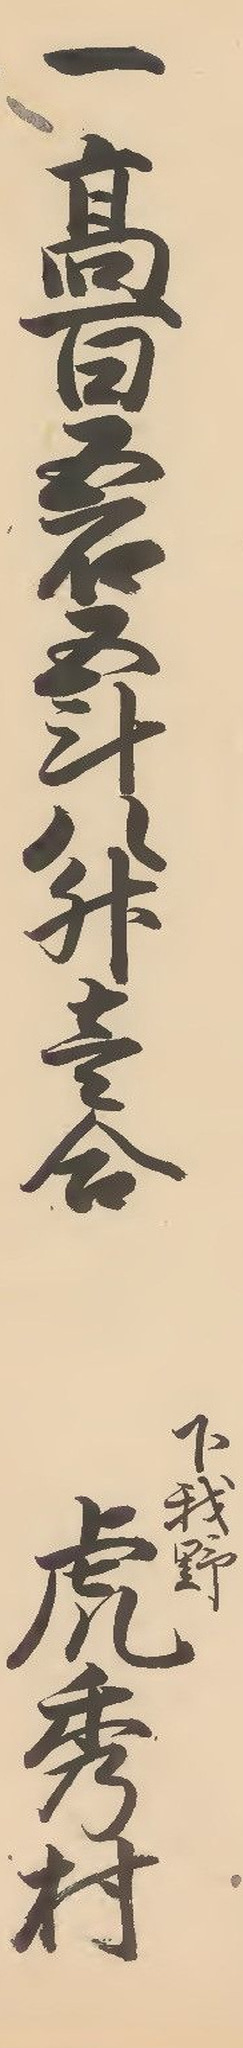一高百五石五斗八升壱合虎秀村

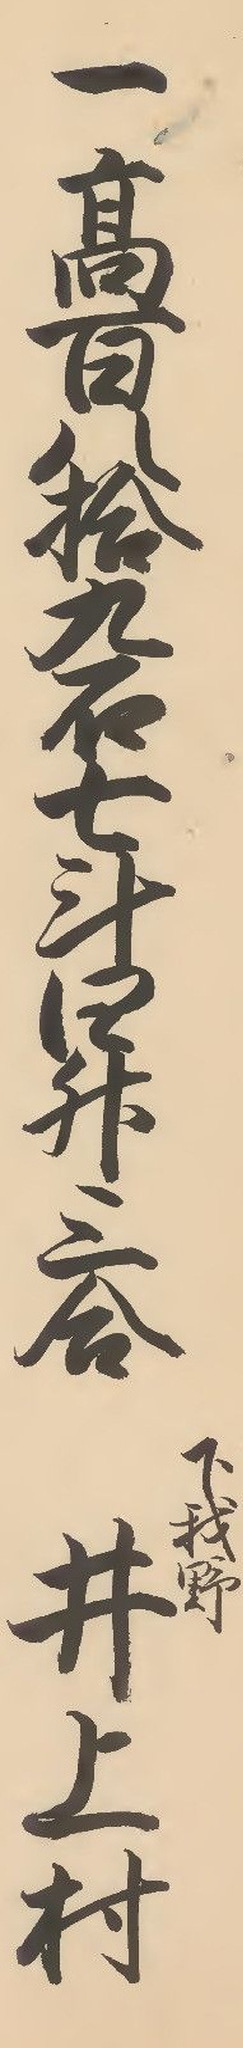一高百八拾九石七斗四升三合井上村
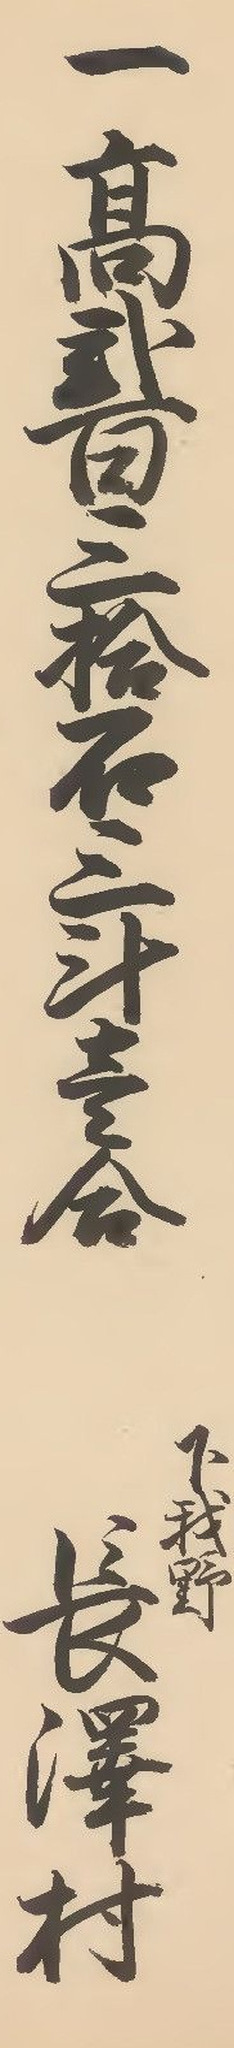一高弐百三拾石三斗壱合長澤村
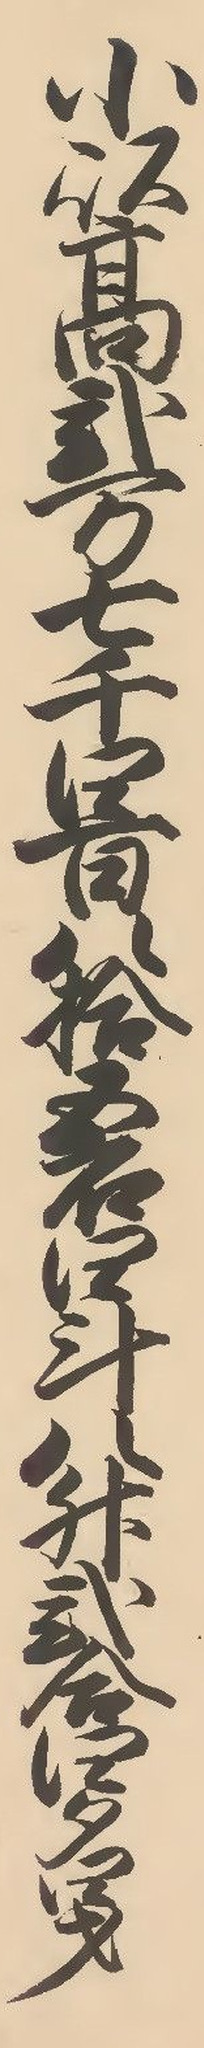小以高弐万七千四百八拾五石四斗八升弐合四勺四才
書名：武蔵国郷帳　上
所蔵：国立公文書館 National Archives of Japan
